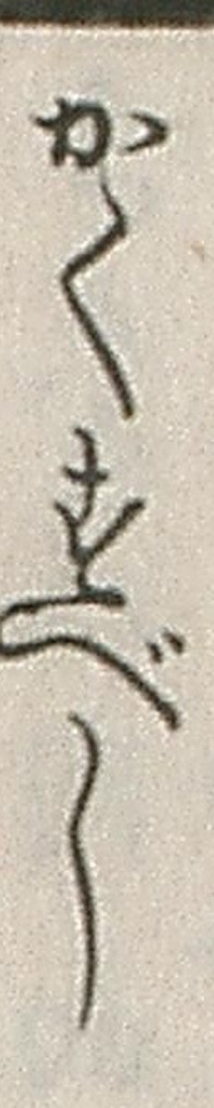かくすべし
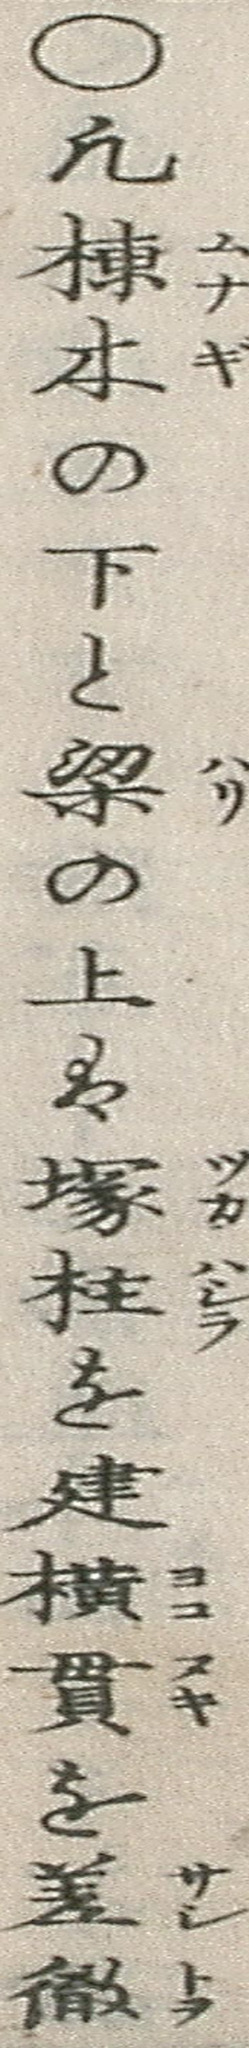〇凡棟木の下と梁の上は塚柱を建横貫を差徹
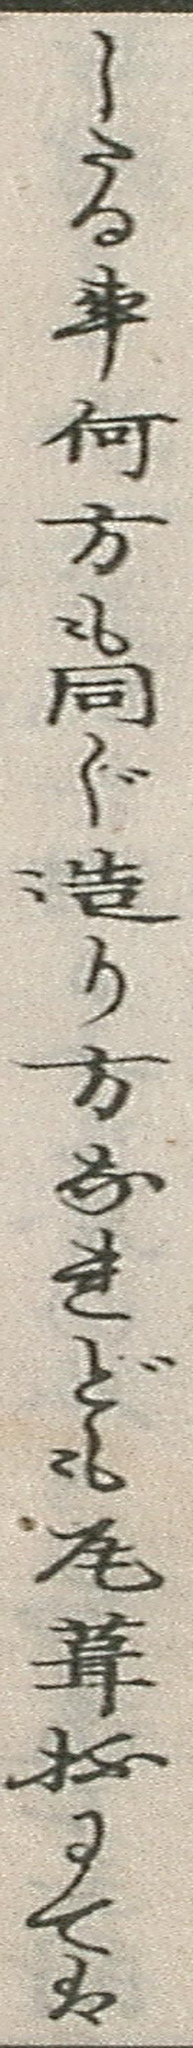したる事何方も同じ造り方なれども瓦葺抔にては
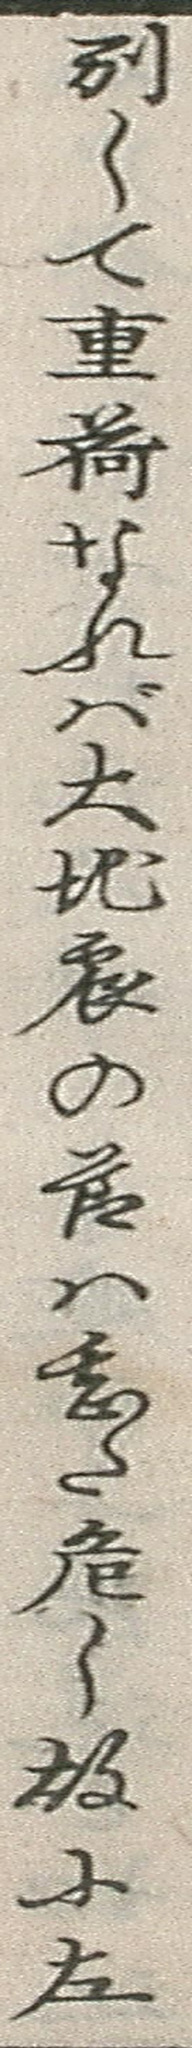別して重荷なれば大地震の節は甚た危し故に左
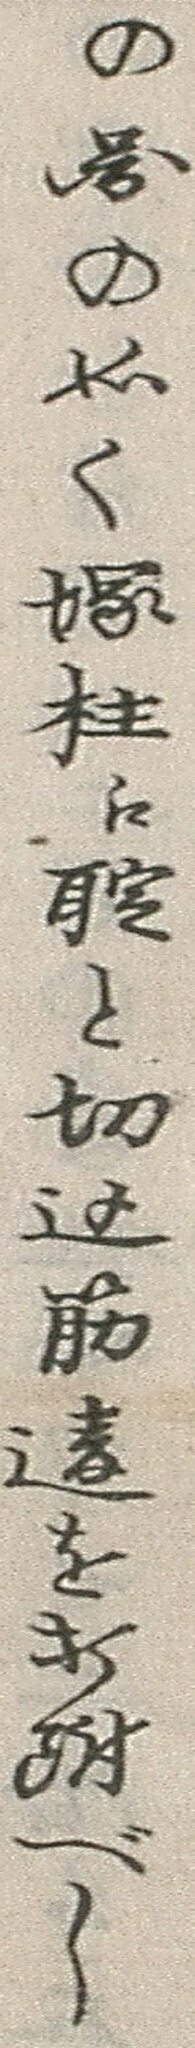の図の如く塚柱江聢と切込筋違を打附べし
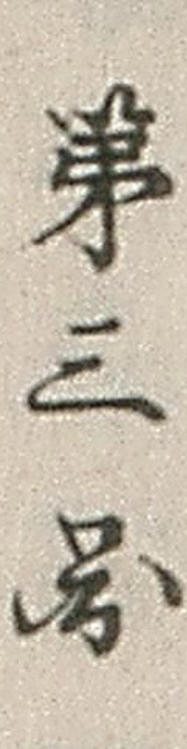第三図

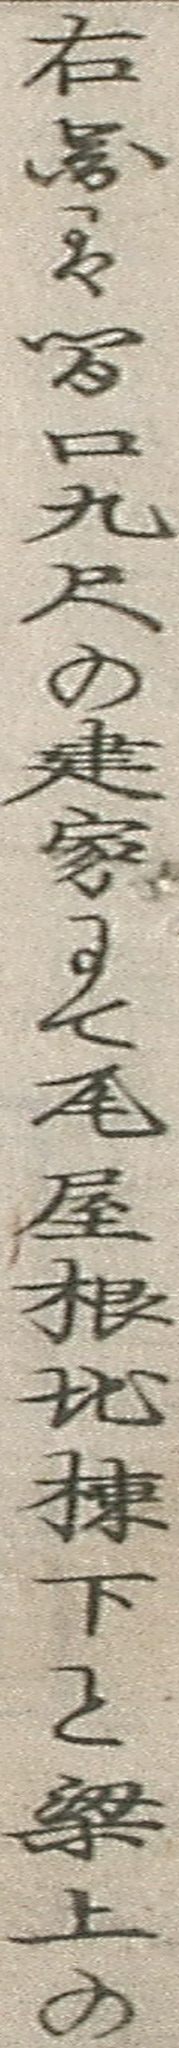右図は間口九尺の建家にて瓦屋根地棟下と梁上の
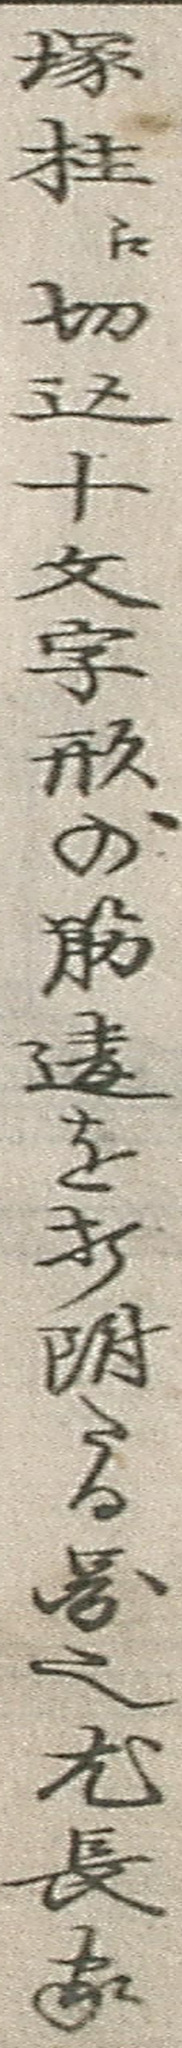塚柱江切込十文字形の筋違を打附たる図也尤長家
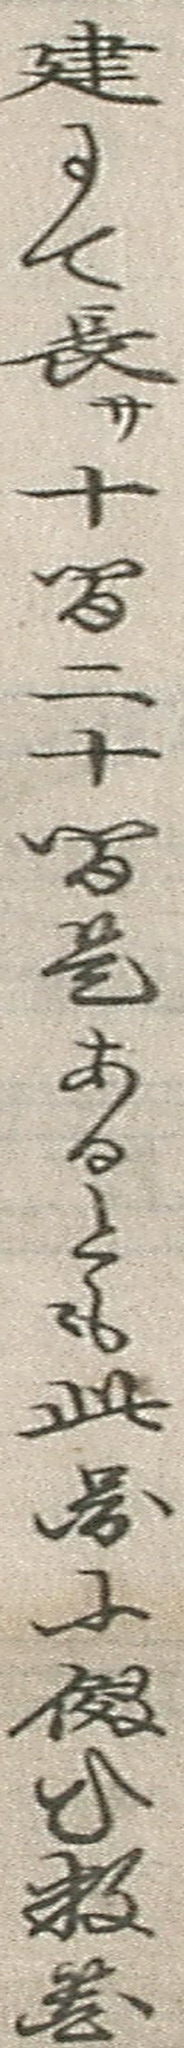建にて長十間二十間是あるとも此図に倣ひ数箇
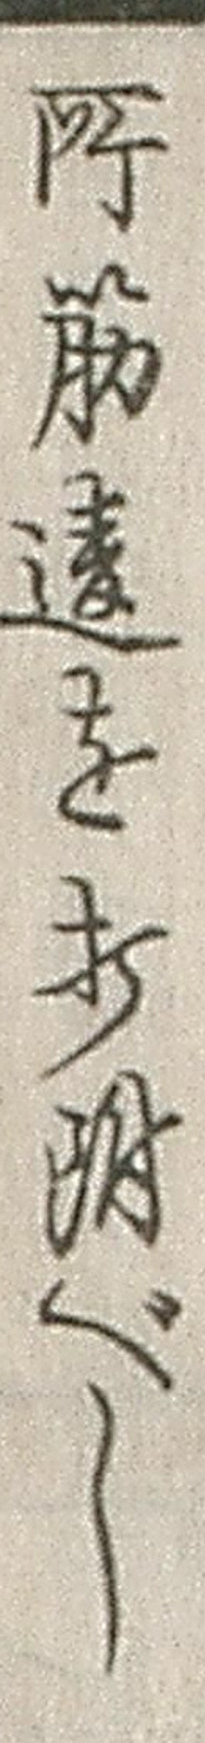所筋違を打附べし
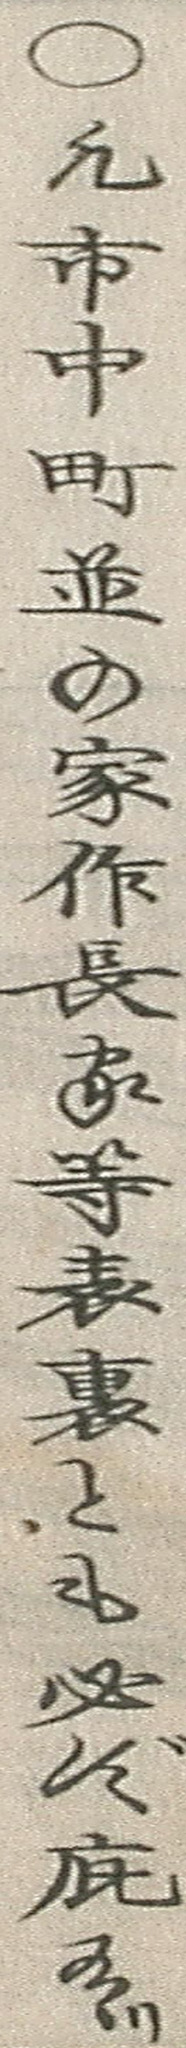〇凡市中町並の家作長家等表裏とも必ず庇有
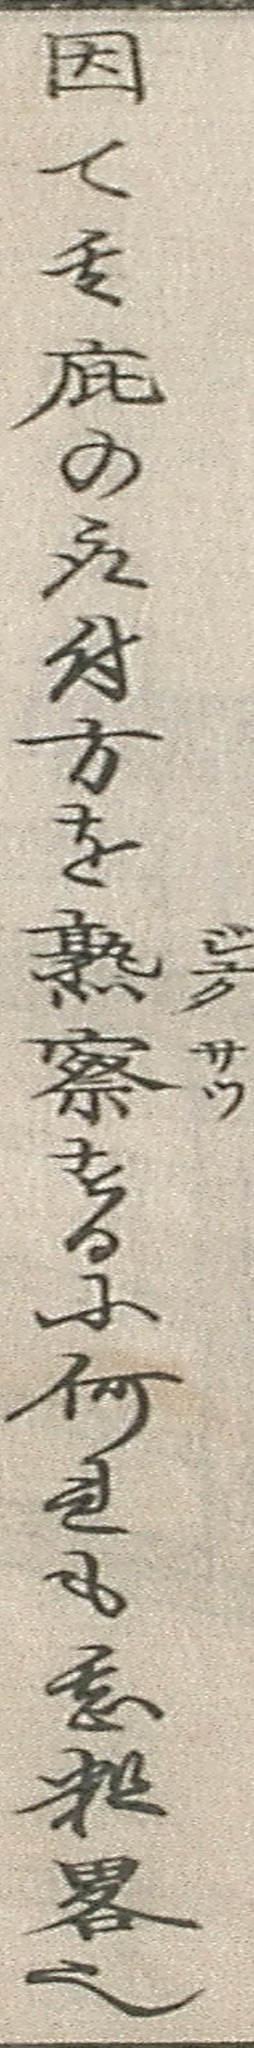因て其庇の取付方を熟察するに何れも甚粗略也
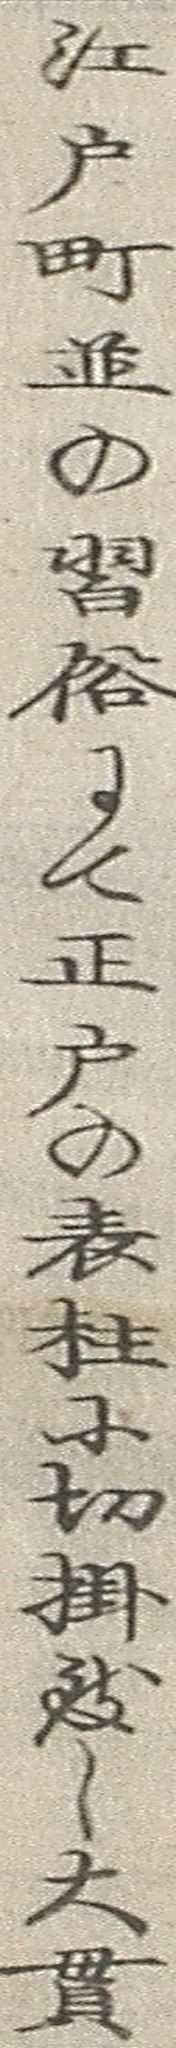江戸町並の習俗にて正戸の表柱に切掛致し大貫
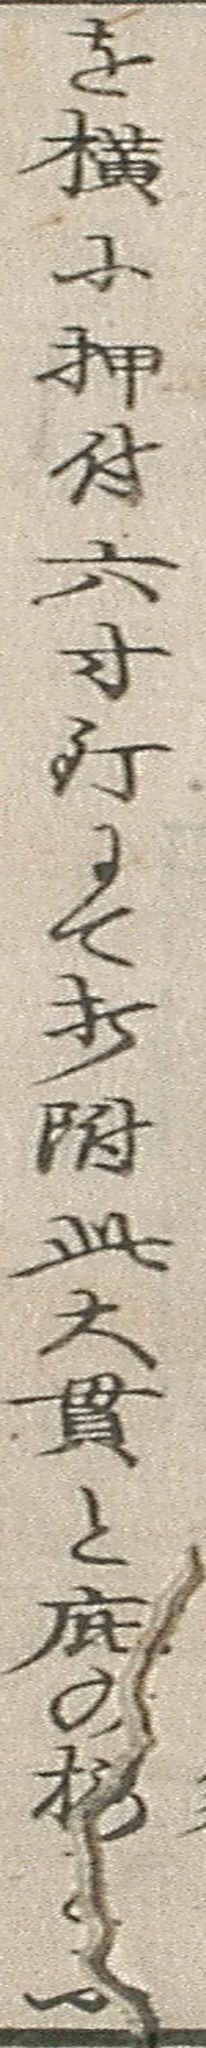を横に押付六寸釘にて打附此大貫と庇の桁とに
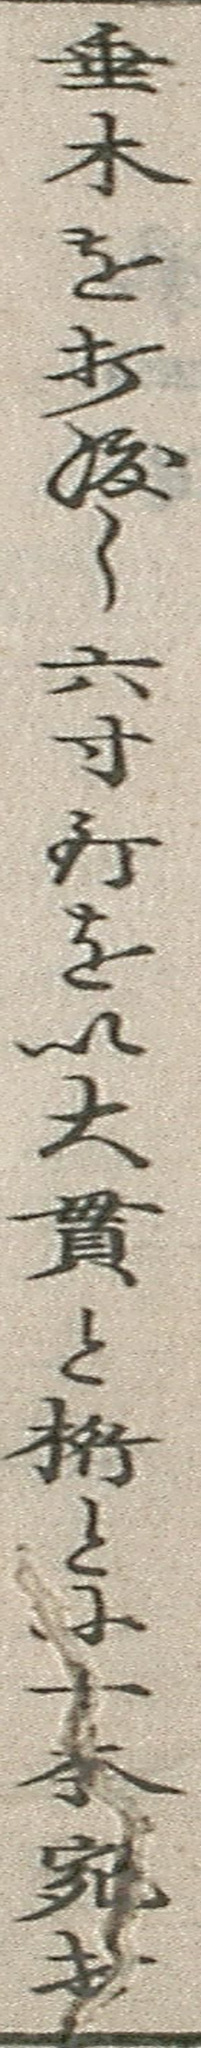垂木を打渡し六寸釘を以て大貫と桁とに十本宛打
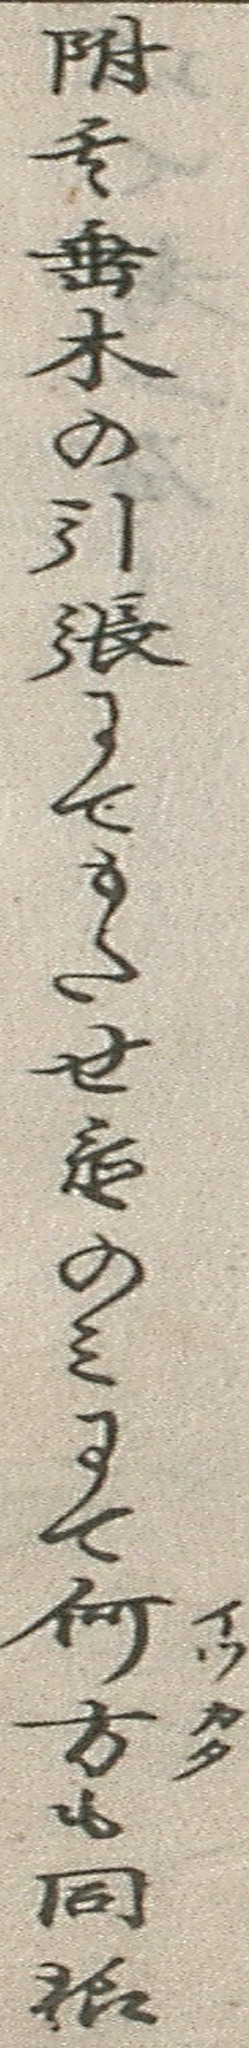附其垂木の引張にてもたせ置のみにて何方も同様
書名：附録　地震劇風災害豫防法圖説（内題）
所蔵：東京大学地震研究所図書室 Earthquake Research Institute Library, The University of Tokyo, JAPAN
